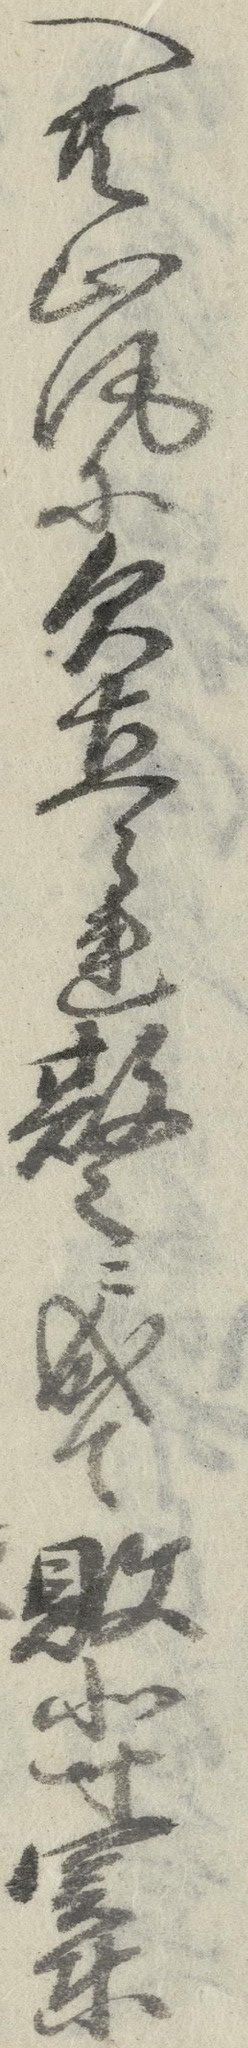へ共山風に欠立られ散々に成て敗北す関東
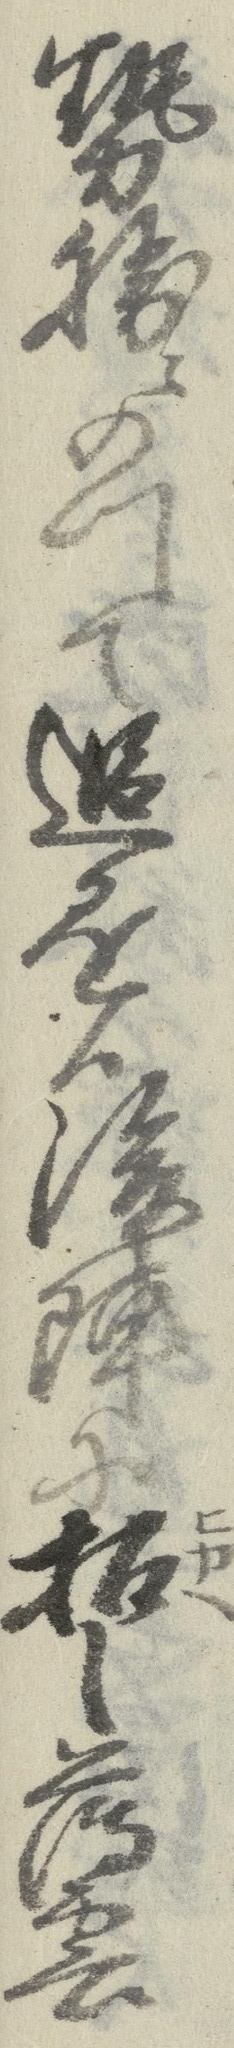勢勝にのつて追懸る後陣に扣し薄雲
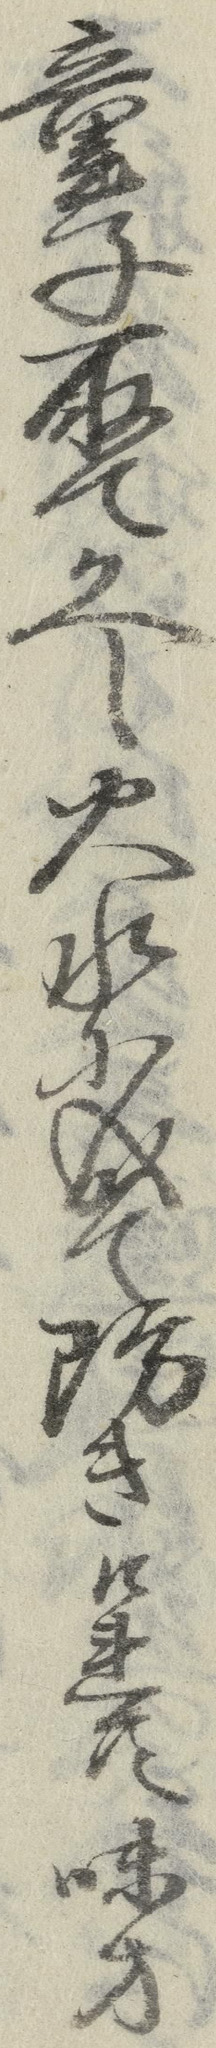童子取てかへし火水に成て防きけれ共味方
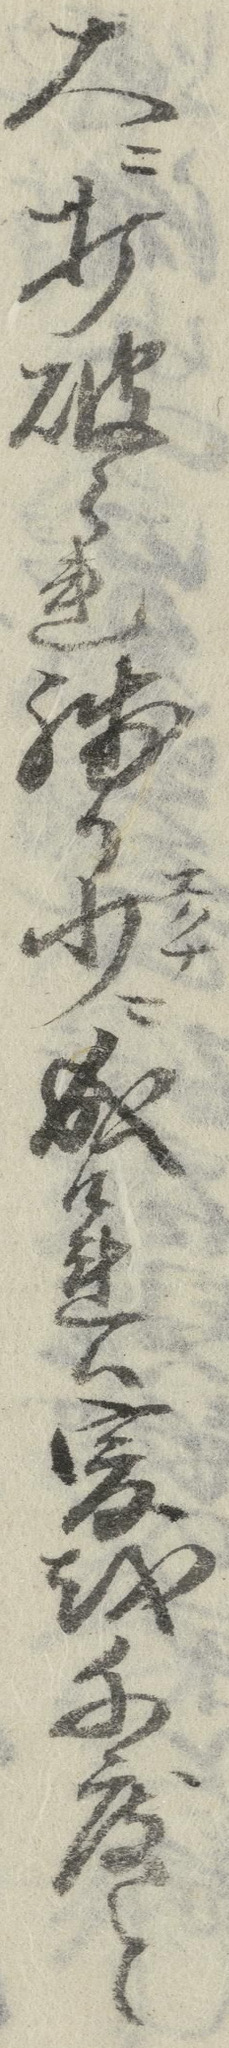大に打破られ残り少に成けれは爰を千度と
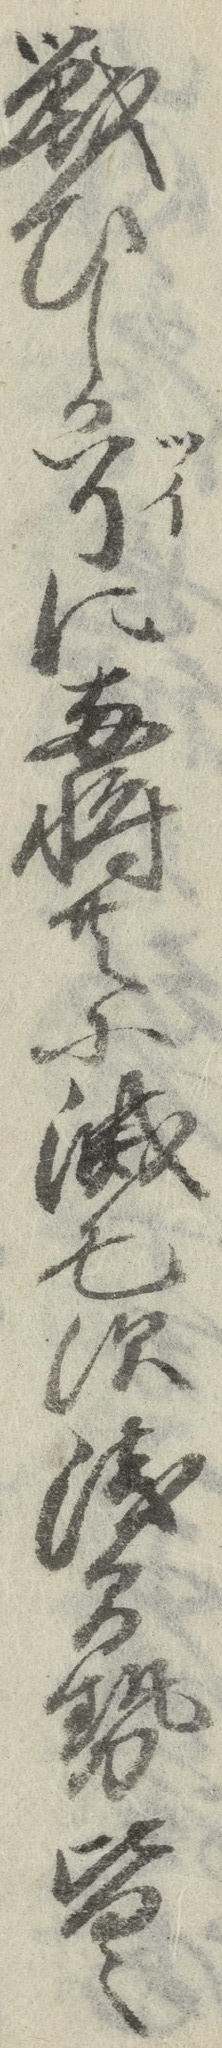戦ひしか了に両将共に滅亡す浅間勢皆々
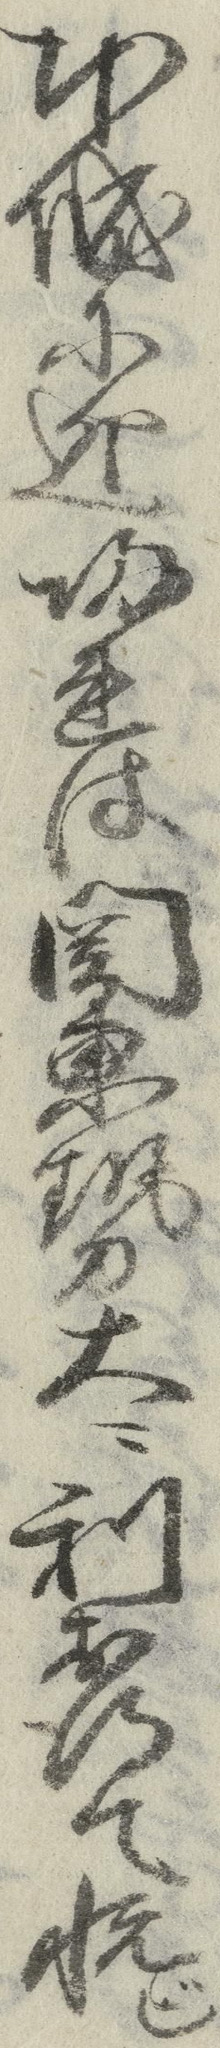本城に逃帰れは関東勢大に利お得て悦び
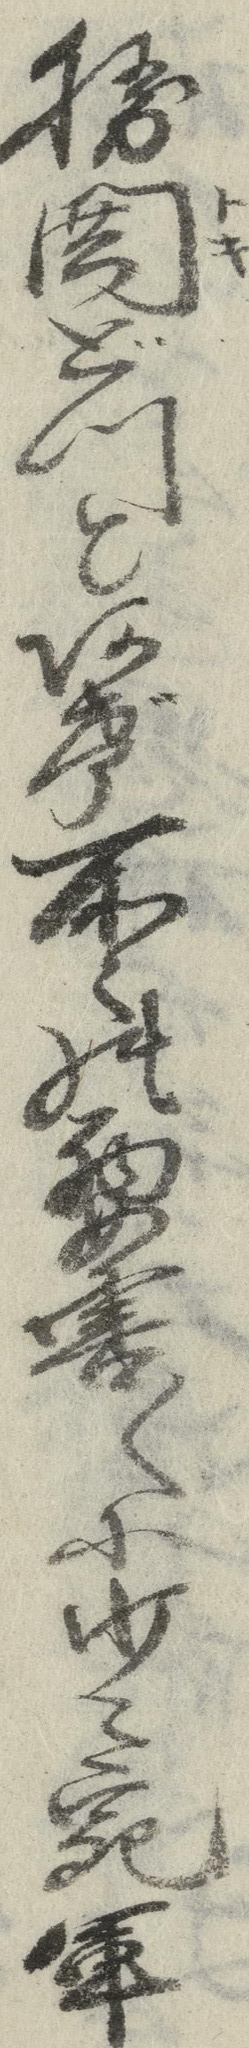勝鬨どつとあげ所々の要害〳〵少々宛軍
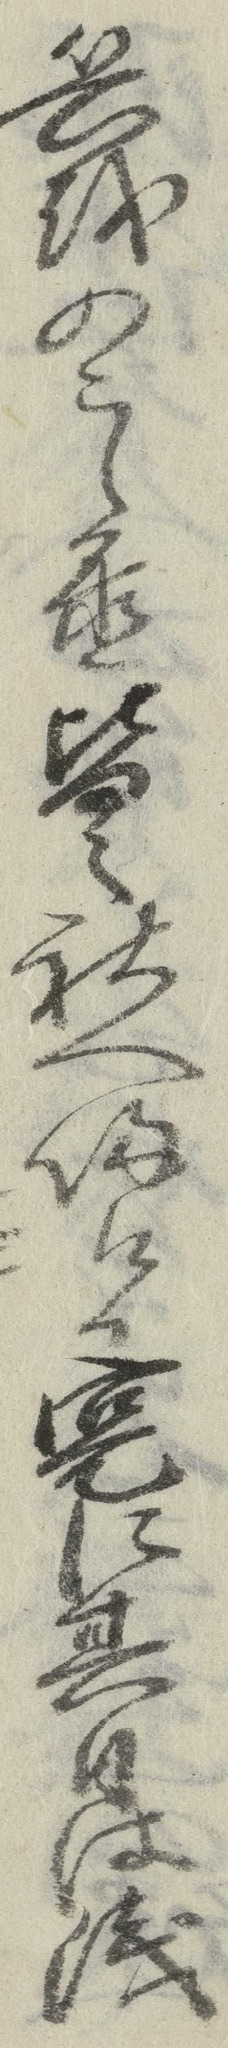兵をのこし置皆々社へ帰ける寔に其日は浅
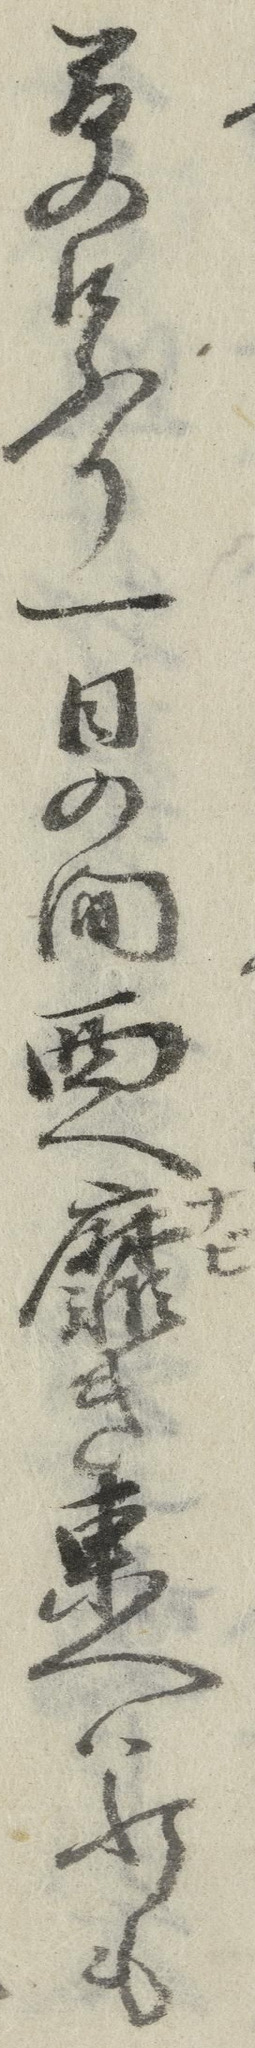間のけふり一日の間西へ靡き東へは少も
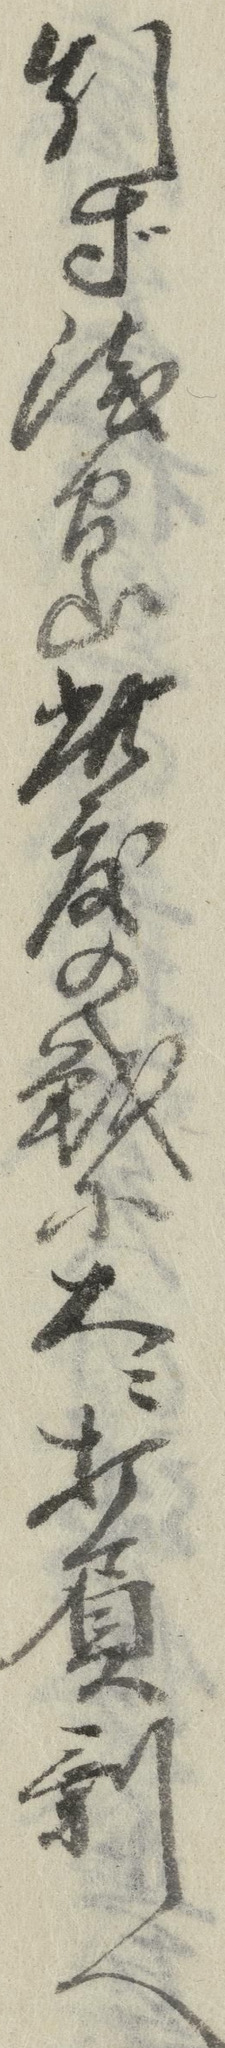引ず浅間山此度の戦に大に打負剰へ

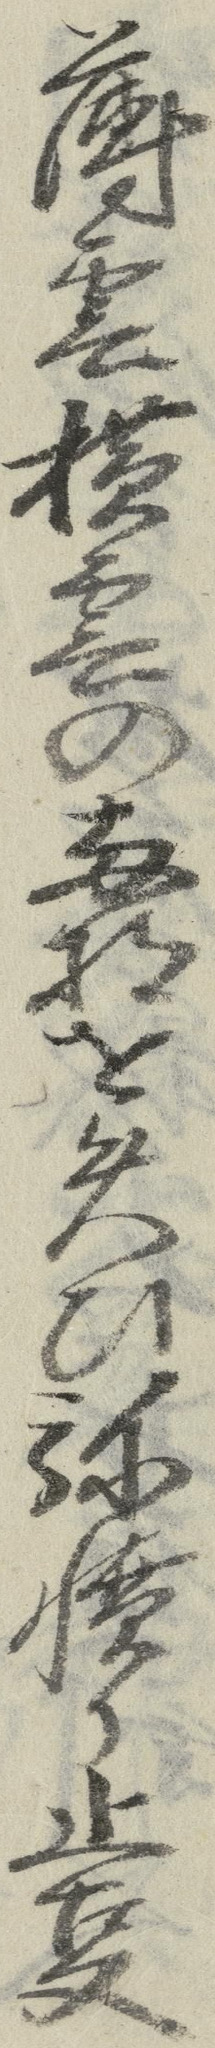薄雲横雲の両将を失ひ弥憤り止事
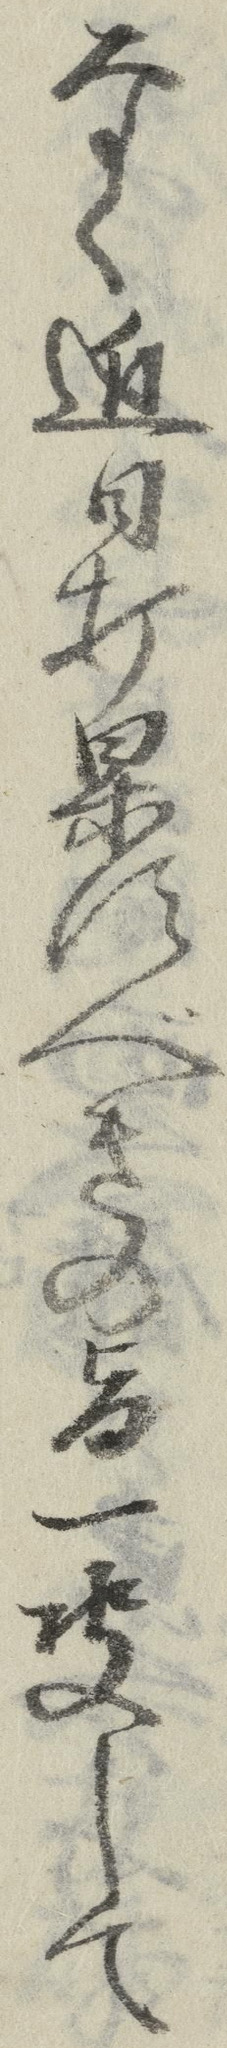なく近日打果すべきの旨一決して
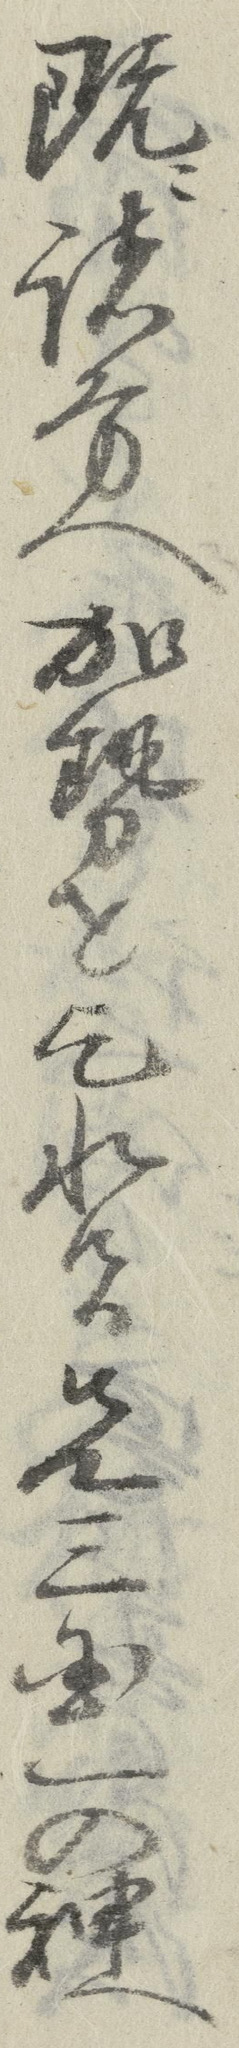既に諸方へ加勢を乞れける先三国一の神へ
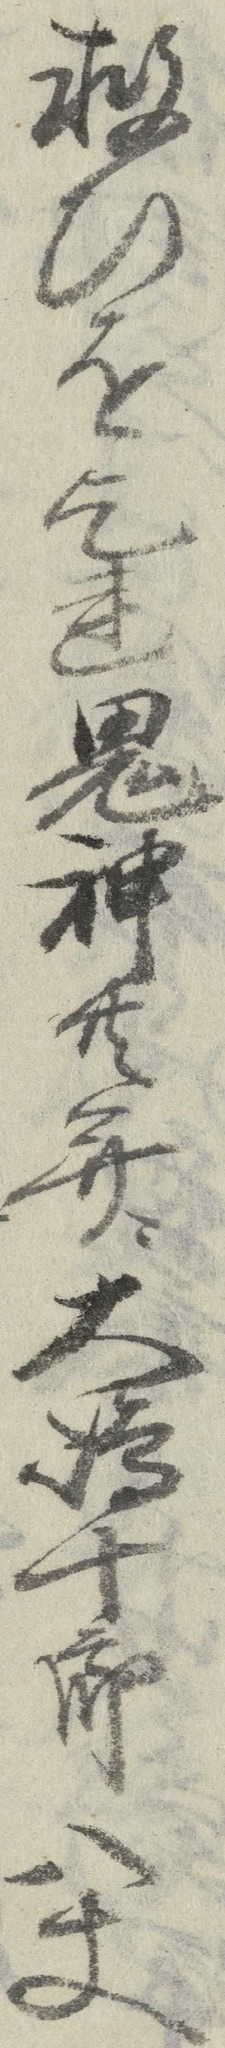救ひを乞れ鬼神共幷に大嶋十郎八丈
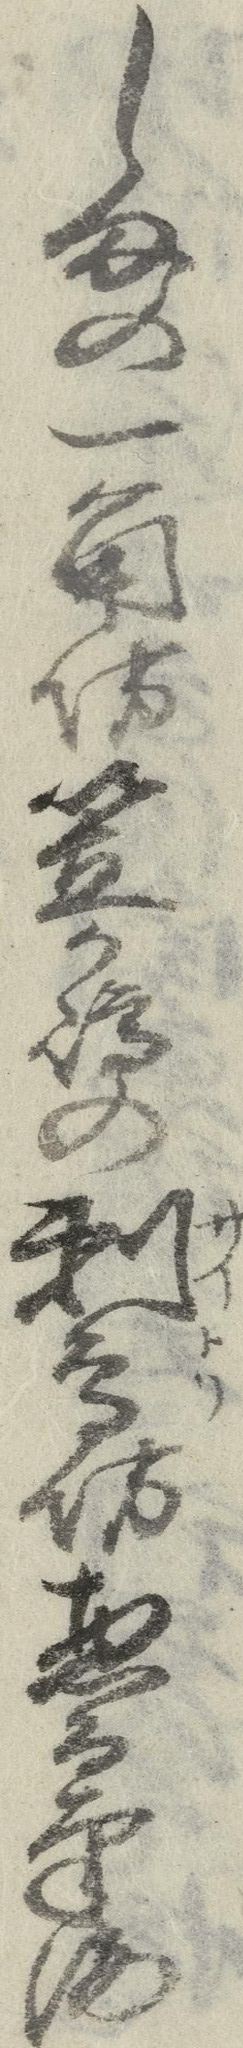しまの一角坊笠か嶋の刺鳥坊惣而東海
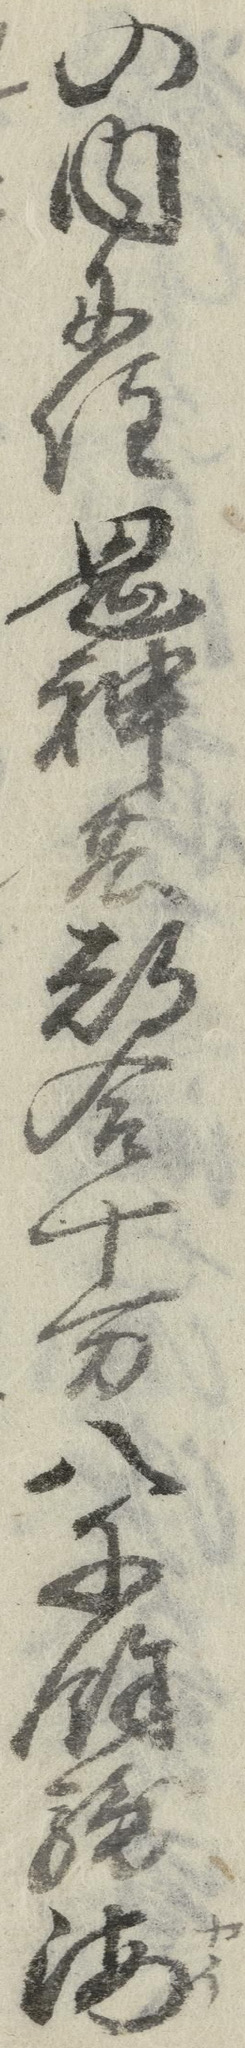の内に住鬼神共都合十万八千余強海
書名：浅間大焼騒動記　上
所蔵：東京大学地震研究所図書室 Earthquake Research Institute Library, The University of Tokyo, JAPAN
